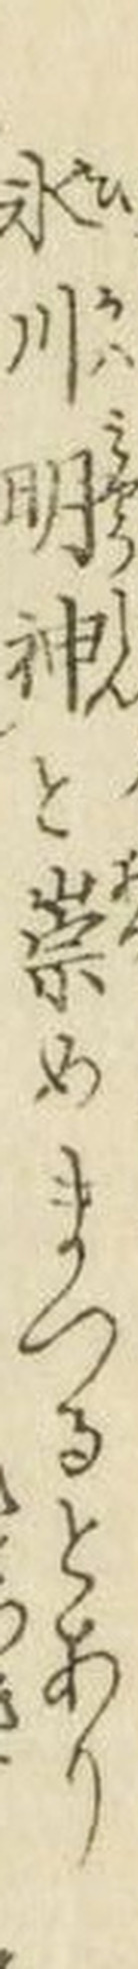氷川明神と崇めまつるとあり
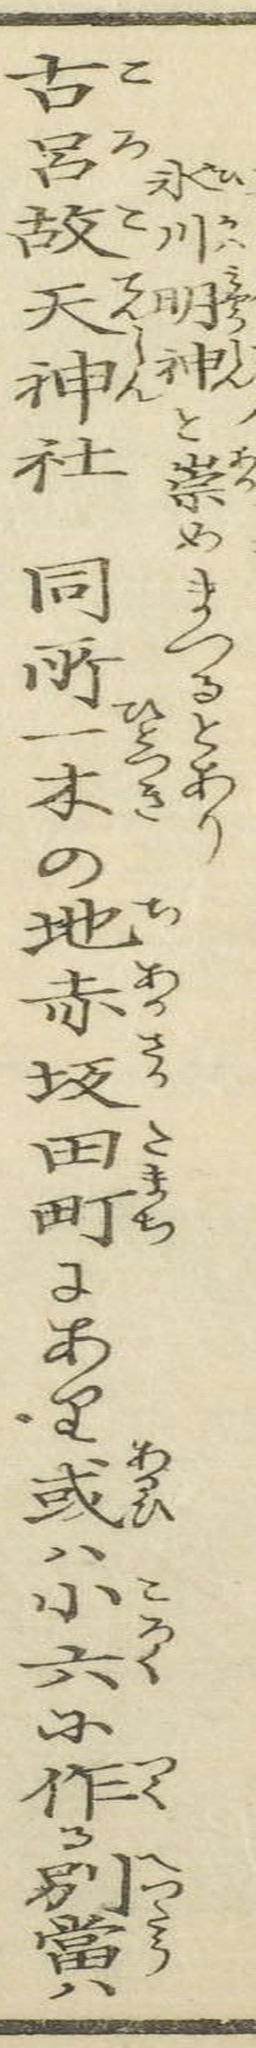古呂故天神社同所一木の地赤坂田町にあり或は小六に作る別當は
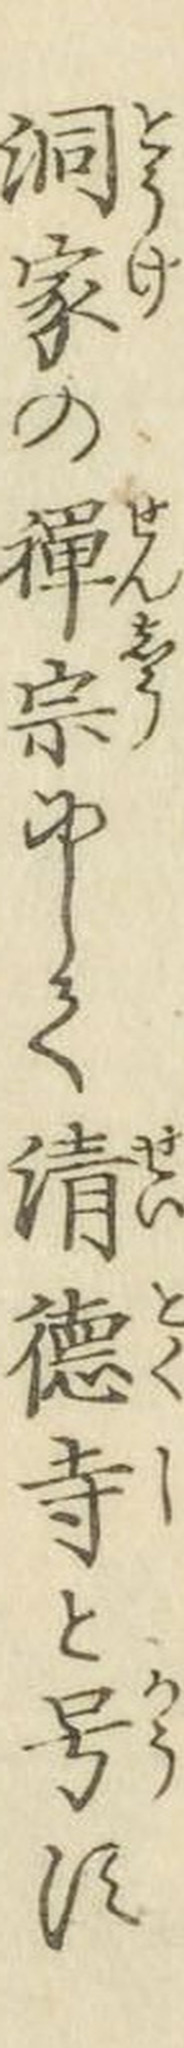洞家の禪宗にして清德寺と号す
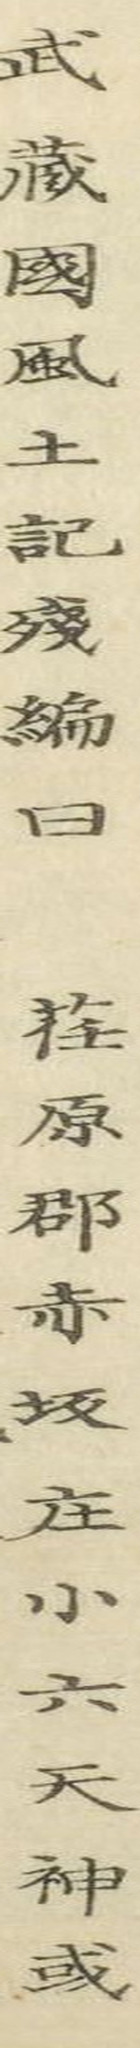武蔵國風土記殘編曰荏原郡赤坂庄小六天神或
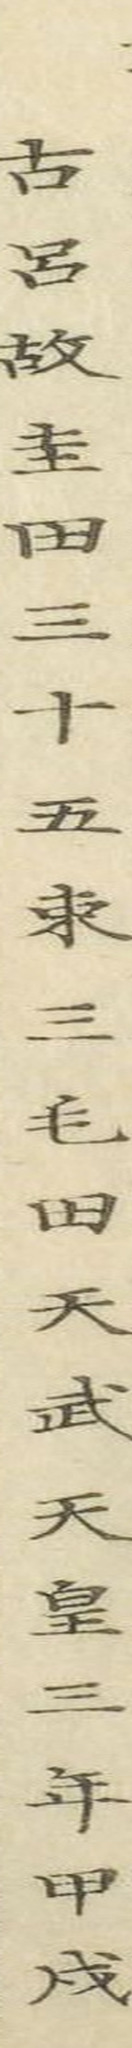古呂故圭田三十五束三毛田天武天皇三年甲戌
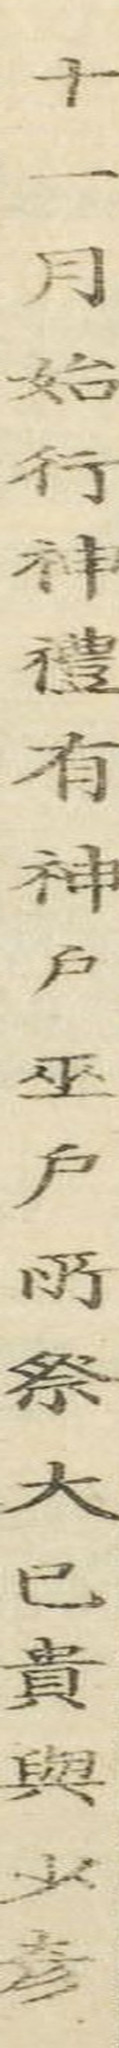十一月始行神禮有神戸巫戸所祭大巳貴與少彦
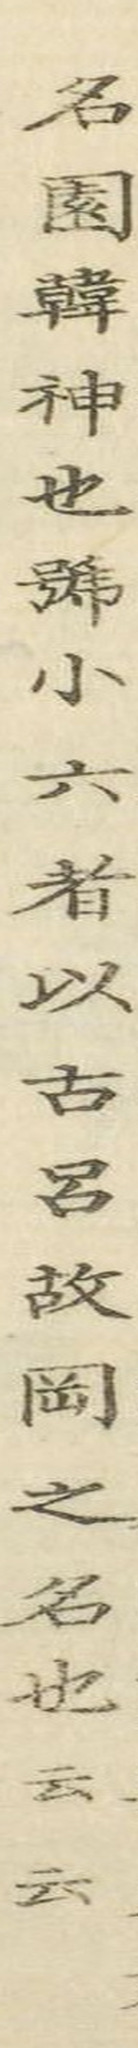名園韓神也號小六者以古呂故岡之名也云云
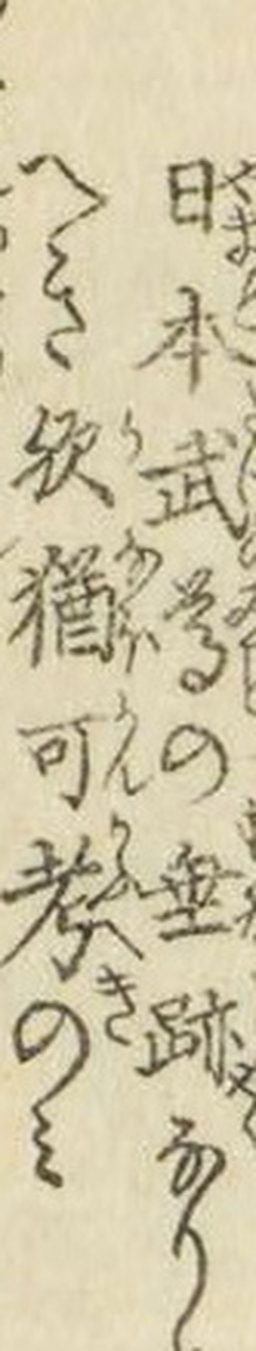へき歟猶可考のみ
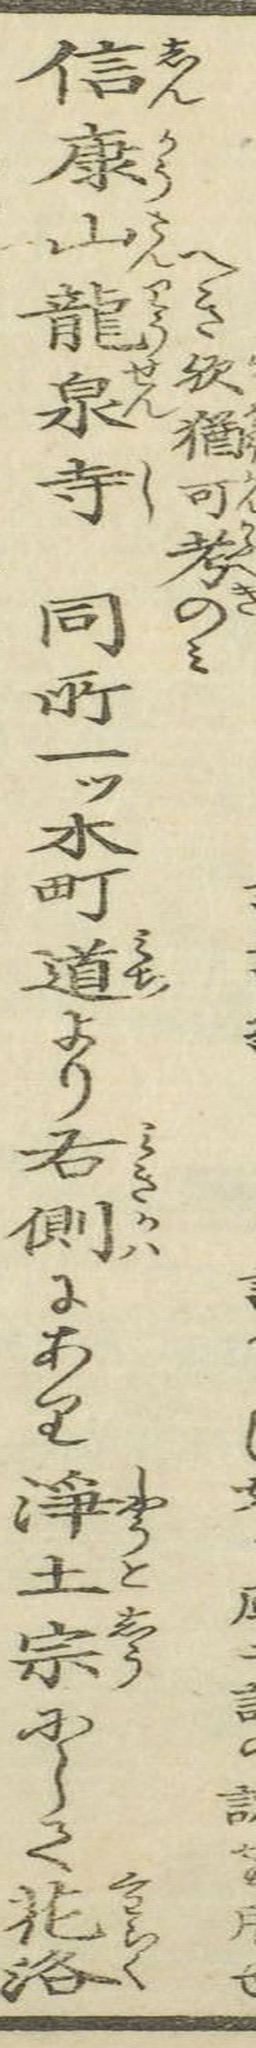信康山龍泉寺同所一ッ木町道より右側にあり淨土宗にして花洛
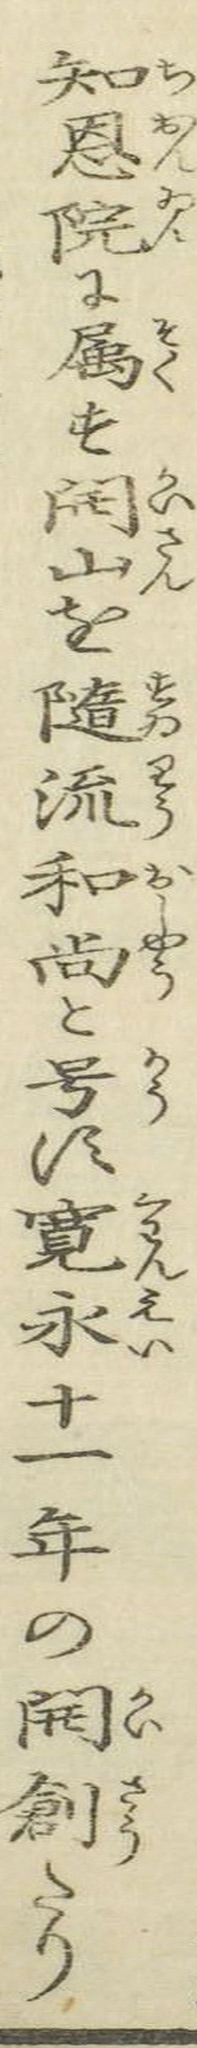知恩院に属す開山を隨流和尚と号す寛永十一年の開創たり
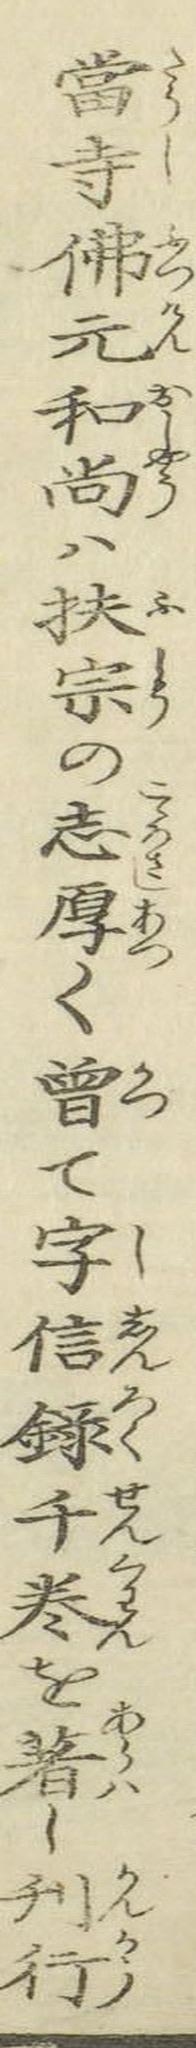當寺佛元和尚は扶宗の志厚く曾て字信録千巻を著し刊行
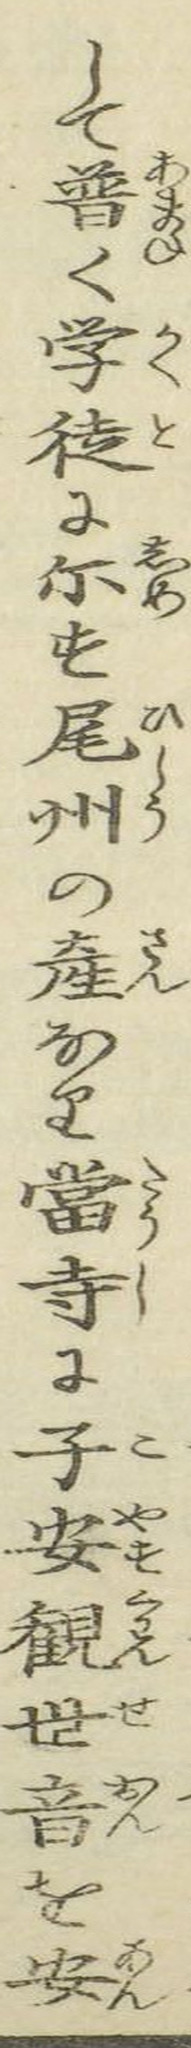して普く学徒に尓す尾州の産なり當寺に子安観世音を安
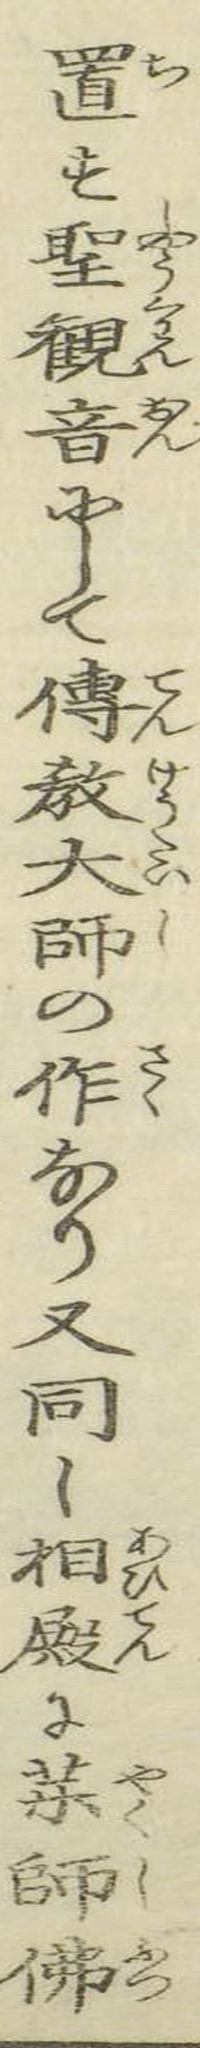置す聖観音にして傳敎大師の作なり又同し相殿に薬師佛
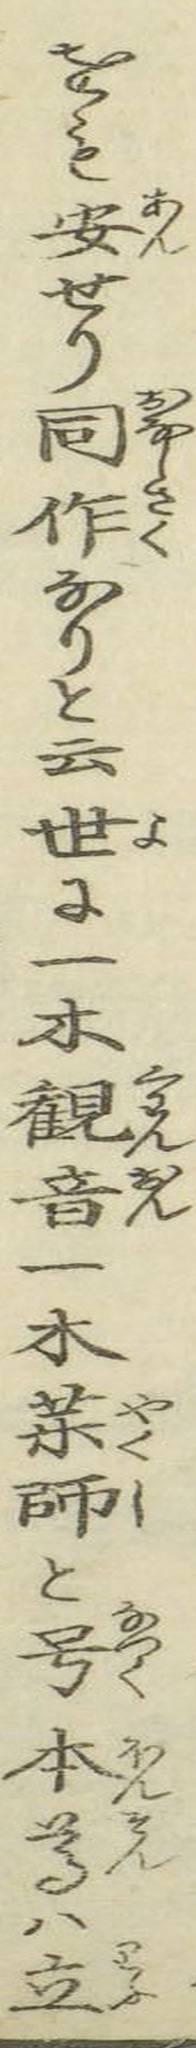をも安せり同作なりと云世に一木観音一木薬師と号本尊は立
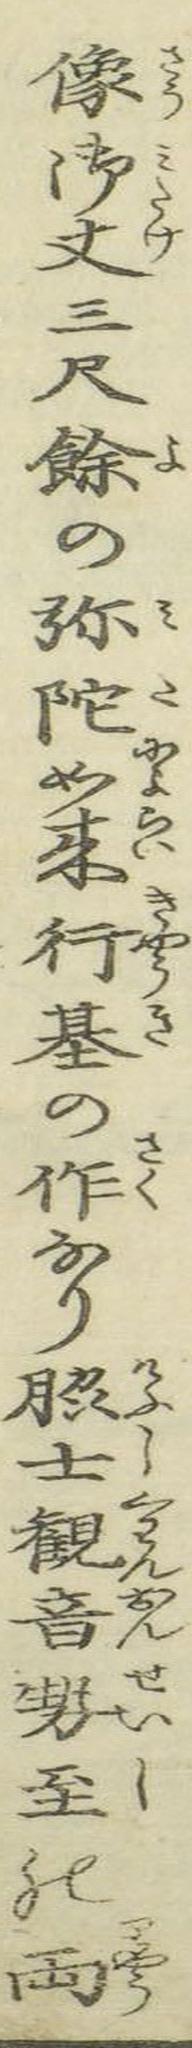像御丈三尺餘の弥陀如来行基の作なり脇士観音㔟至の両
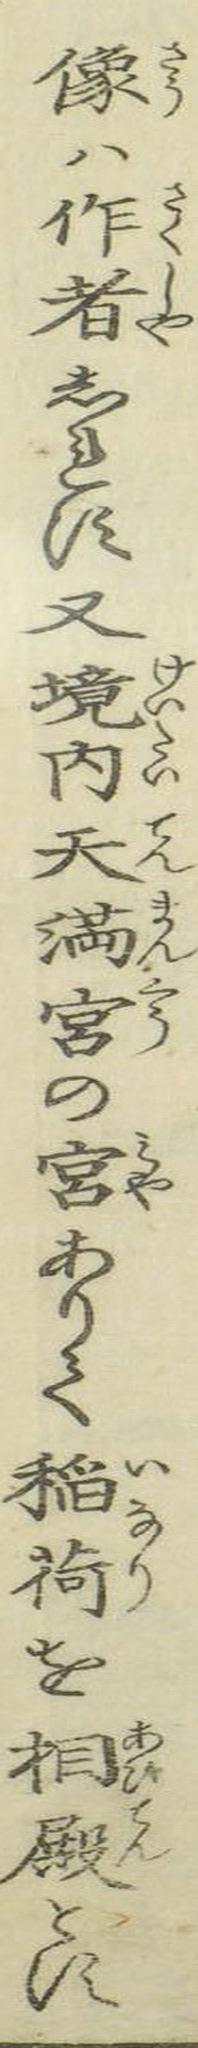像は作者しらす又境内天満宮の宮ありて稲荷を相殿とす
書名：江戸名所図会 20巻 巻之8
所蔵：東京学芸大学教育コンテンツアーカイブ
